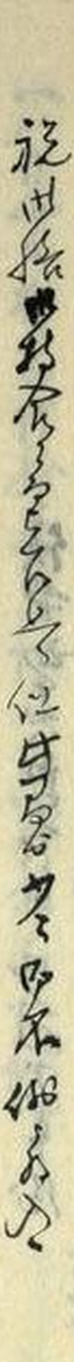祝御膳御待合ニ而被召上候但此間ゟ少々御不例ニ被為入候
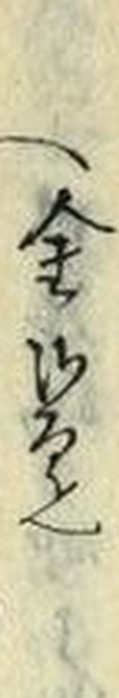金弐百疋
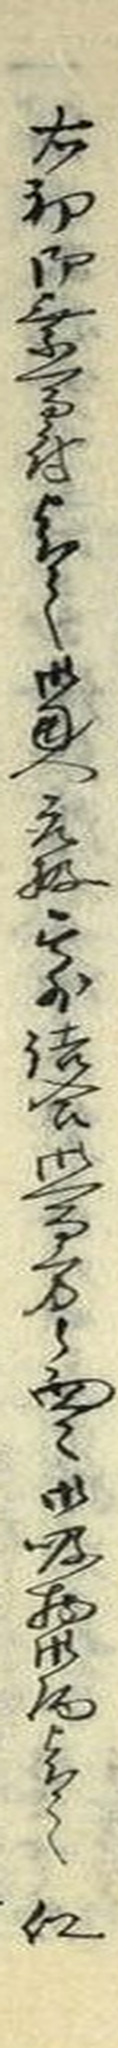右初御乗馬ニ付被下之御用人取扱其外詰合御馬方之面々御御吸物御酒被下之但
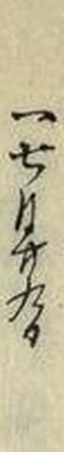一七月晦日
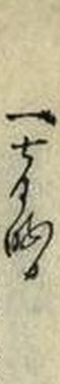一七月晦日
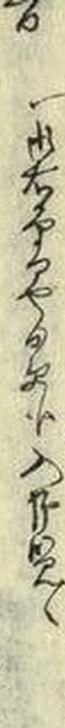御右筆部屋ゟ受取入御覧候
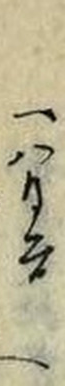一七月晦日
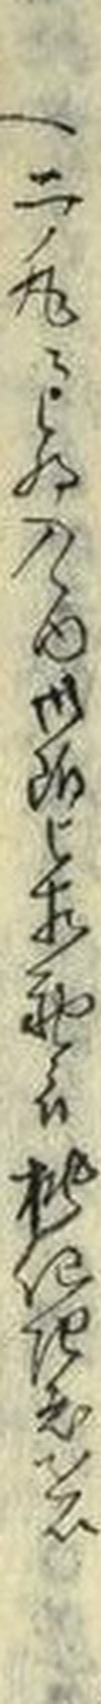一八月二日二ノ丸ニ被為入候内御附被相勤候ニ付桃仙院老を以
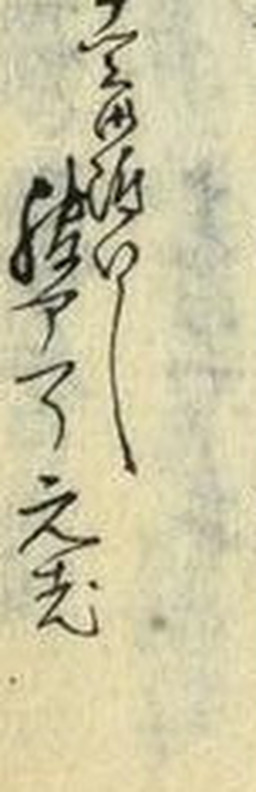服部了元老

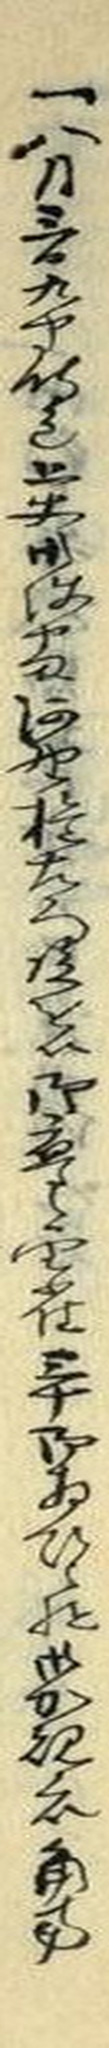一八月三日九半時過上使御使番河野権左衛門殿を以御鷹之雲雀三十御拝領被遊御加規衆角南
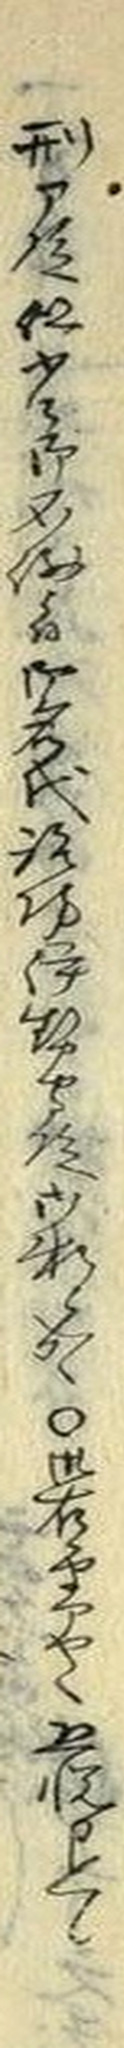刑部殿但少々御不例ニ付御名代諏訪伊勢守殿御頼被成候〇御右筆部屋へ恐悦申上候
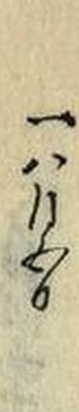一八月五日
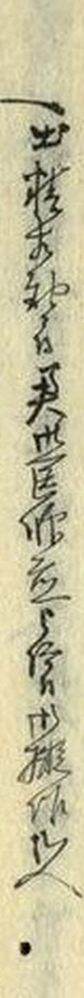出精相勤候ニ付奥御医師並被仰付御擬作弐人
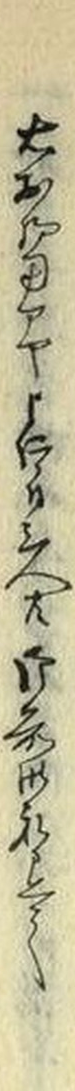右於御用部屋被仰付三人共御前御礼申上之
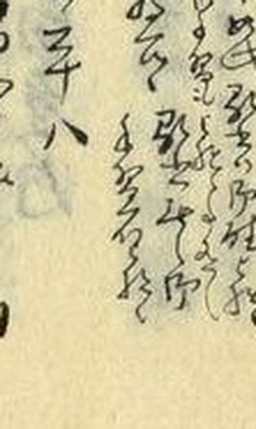手習被遊候
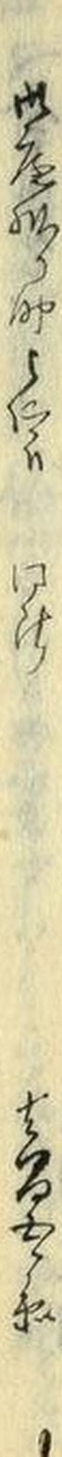御庭掛り助被仰付同断真田五郎兵衛
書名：少傅日録抄（斉善付側向頭取日記、在府）
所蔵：福井県文書館 Fukui Prefectural Archives
